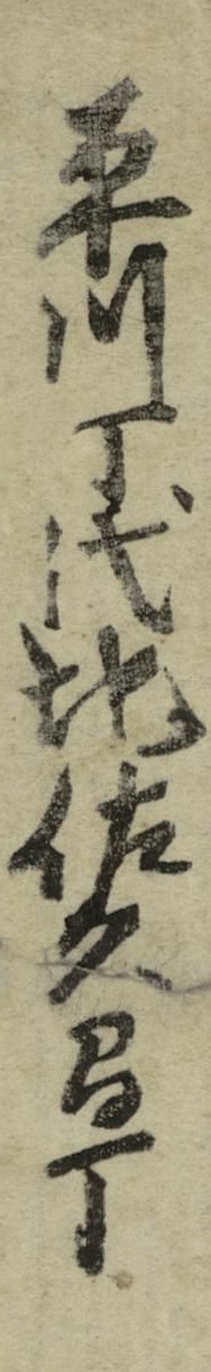平川丁代地佐久間丁
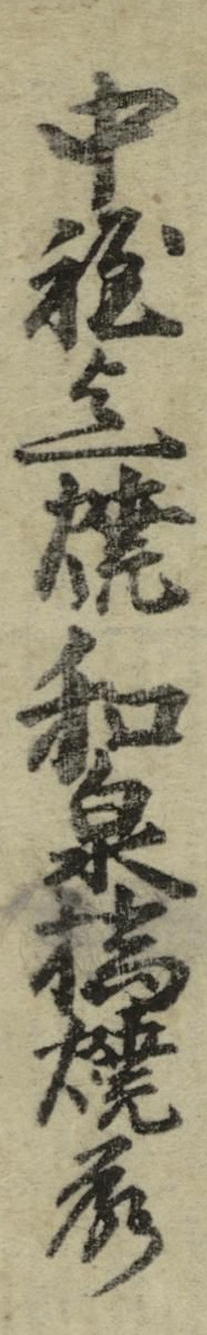中程迄焼和泉橋焼落
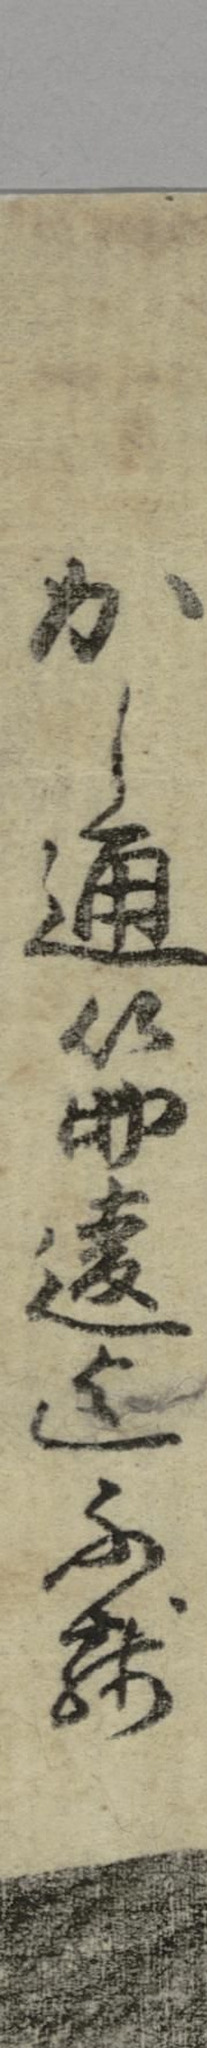かし通筋違迄不残
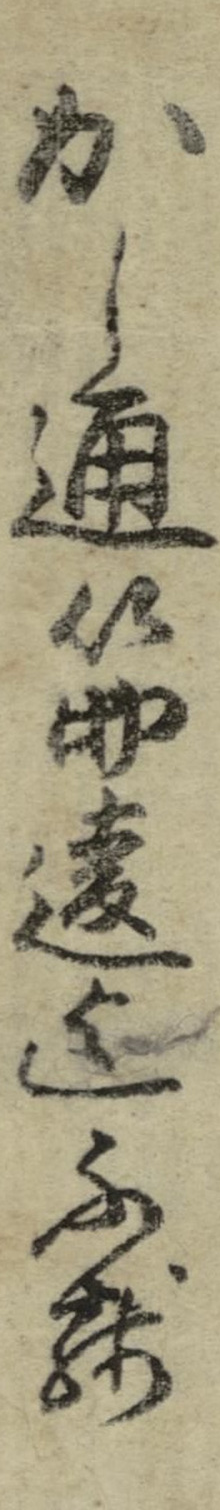かし通筋違迄不残
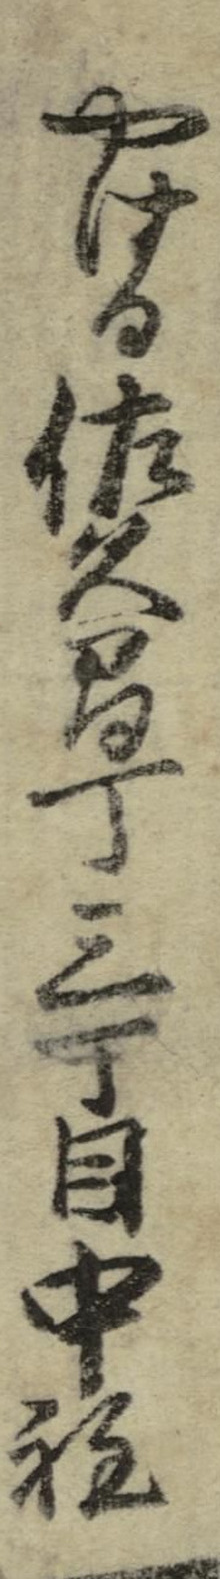やける佐久間丁三丁目中程
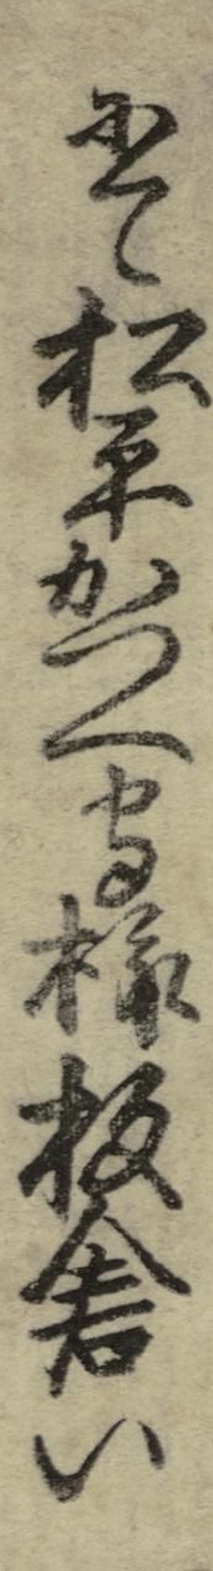にて松平かつへ守様板倉い
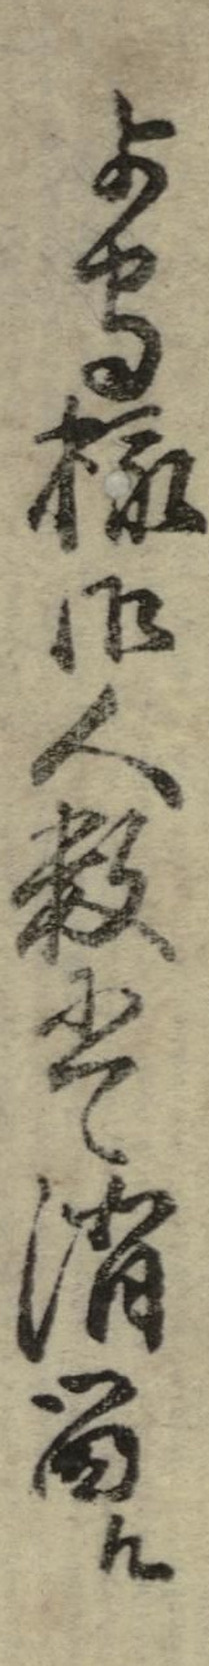よ守様御人数にて消留ル
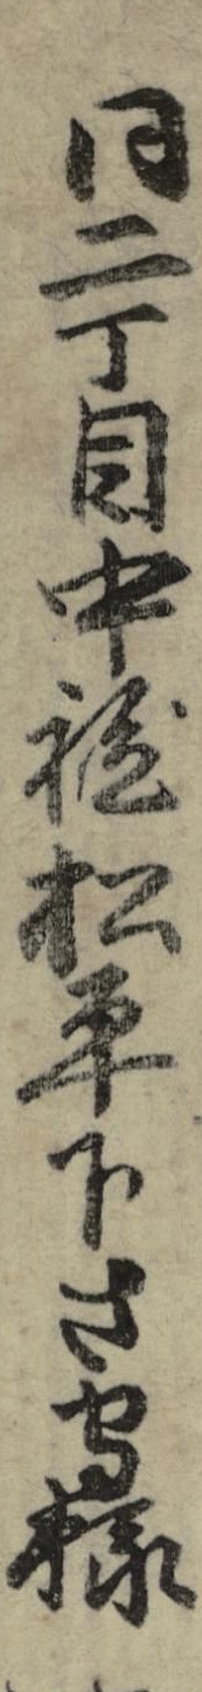同二丁目中程松平下さ守様
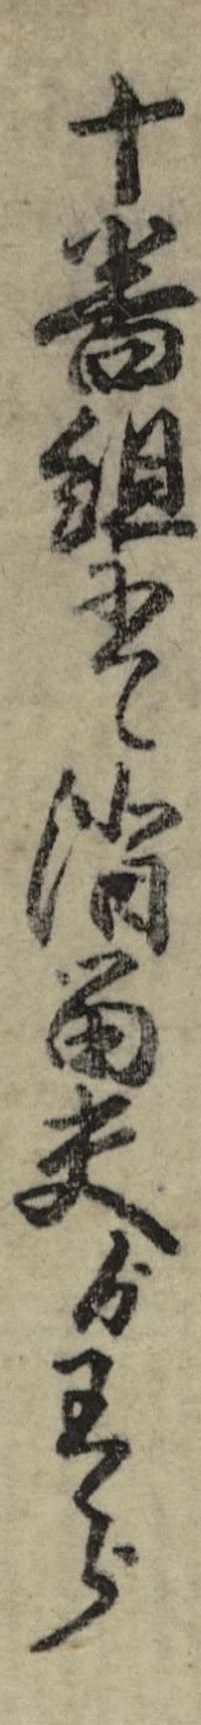十番組にて消留夫ゟわくら
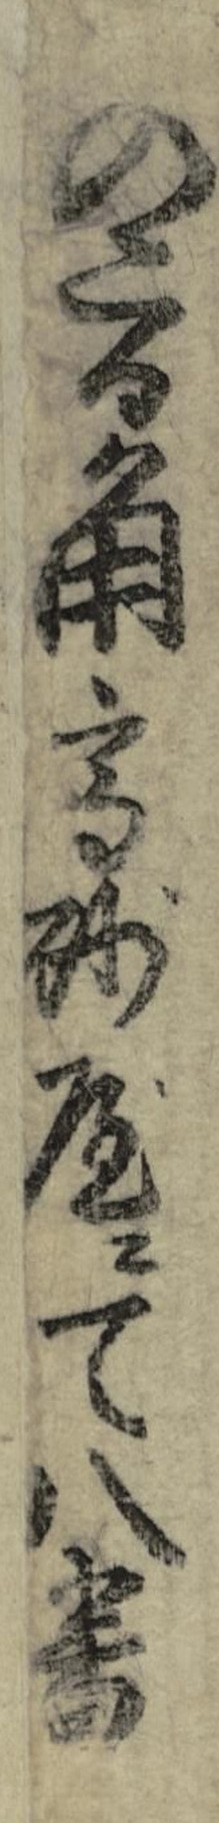のこる角高砂屋にて八番
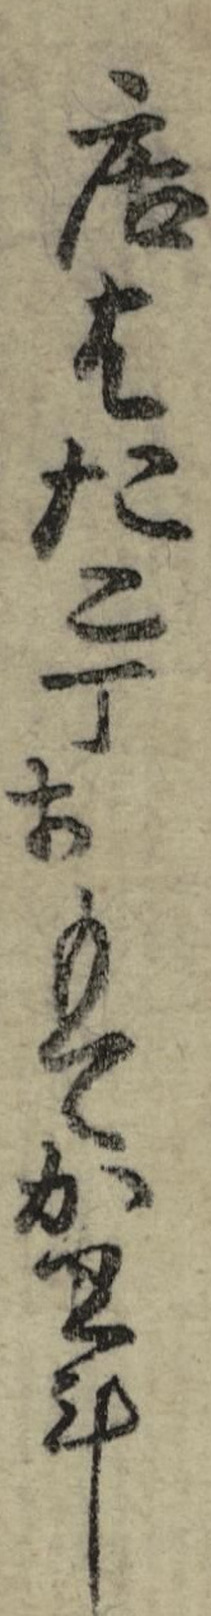店はたこ丁おもてかわ斗
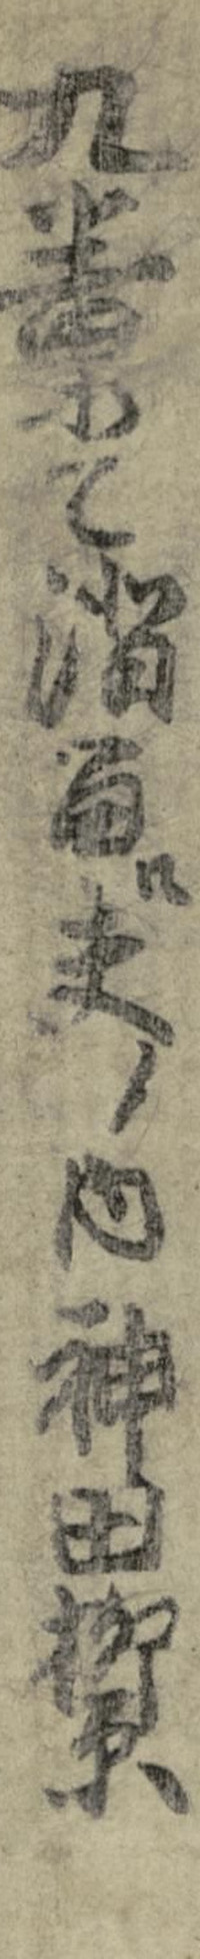九番にて消留ル夫ノ内神田柳原
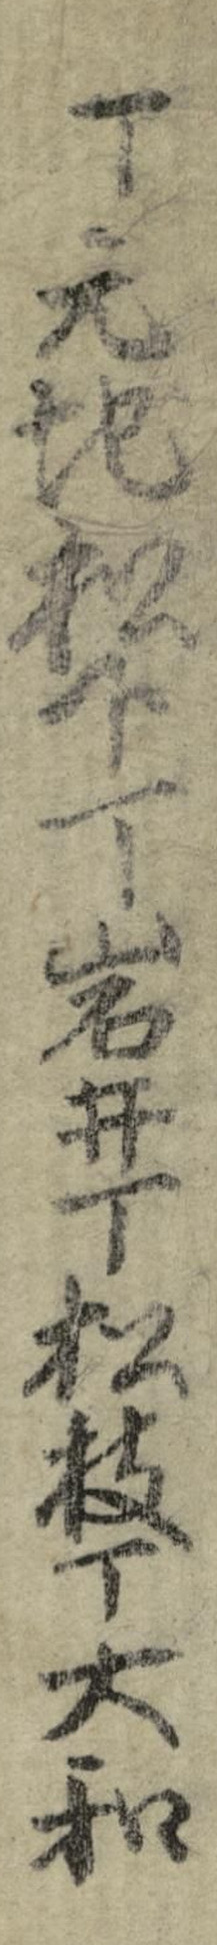丁元地松下丁岩井丁松枝丁大和
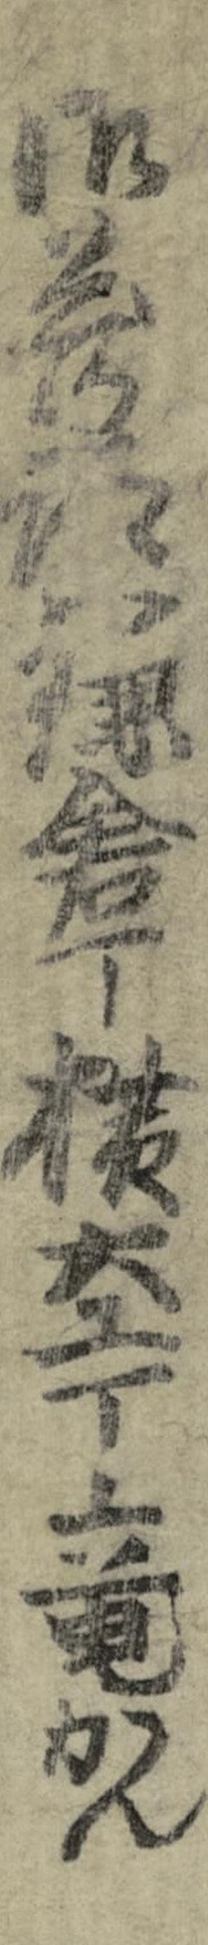御善部鎌倉丁横大工丁竜かん
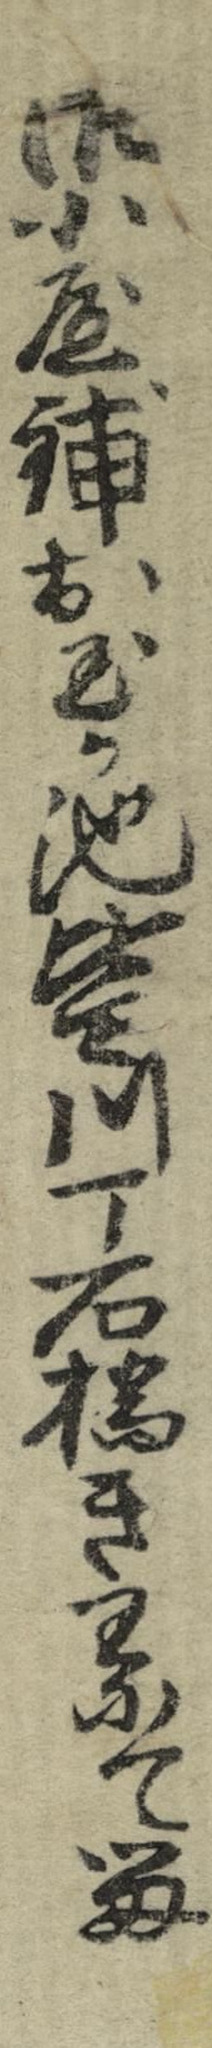御小屋鋪お玉か池皆川丁石搗きわにて留
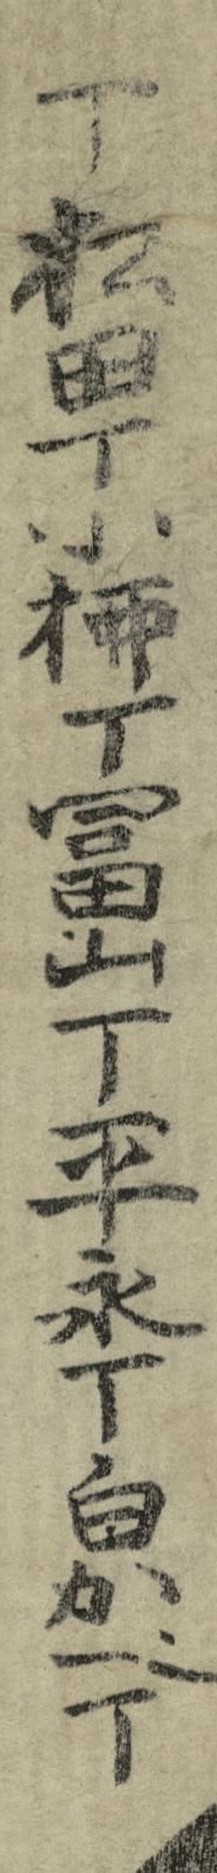丁松田丁小柳丁富山丁平永丁白かべ丁
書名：安政五午十一月十五日焼場方角附
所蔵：東京大学地震研究所図書室 Earthquake Research Institute Library, The University of Tokyo, JAPAN
